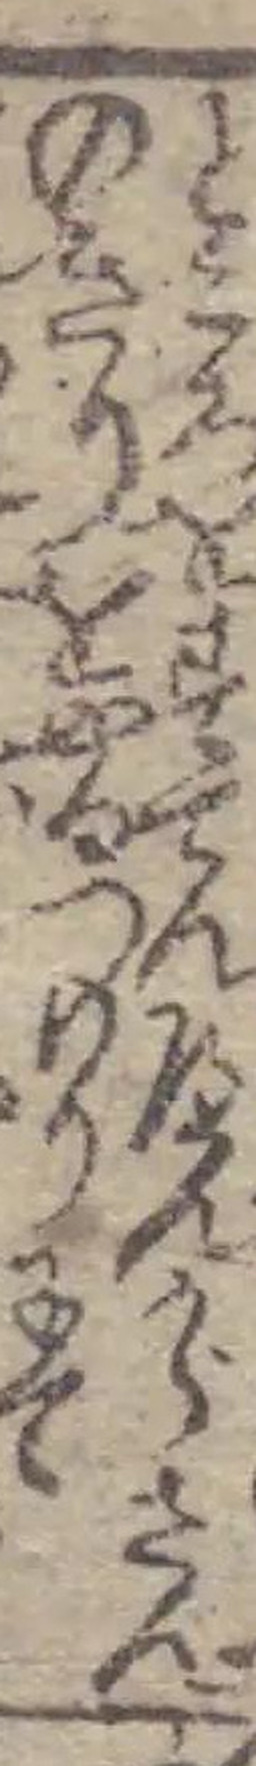のきりをやるつもりにて
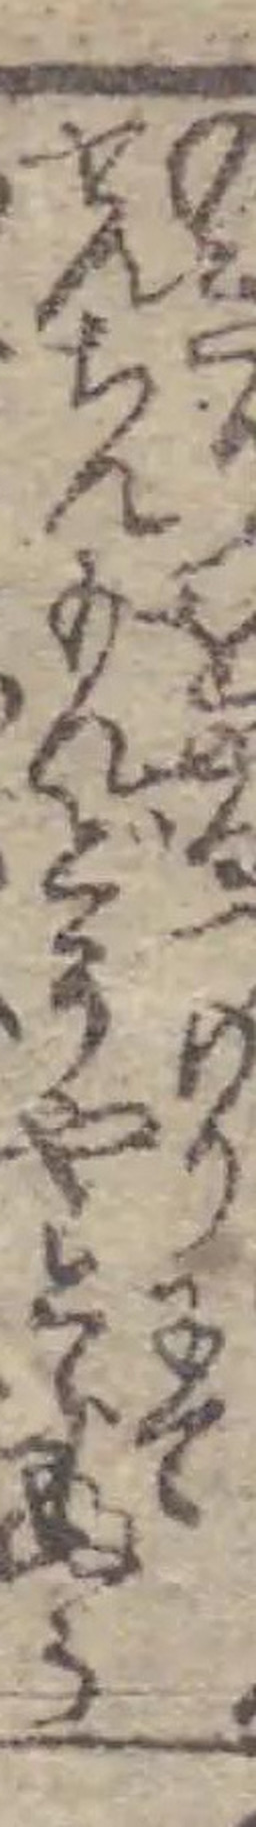せんちんもんどうやとらふう
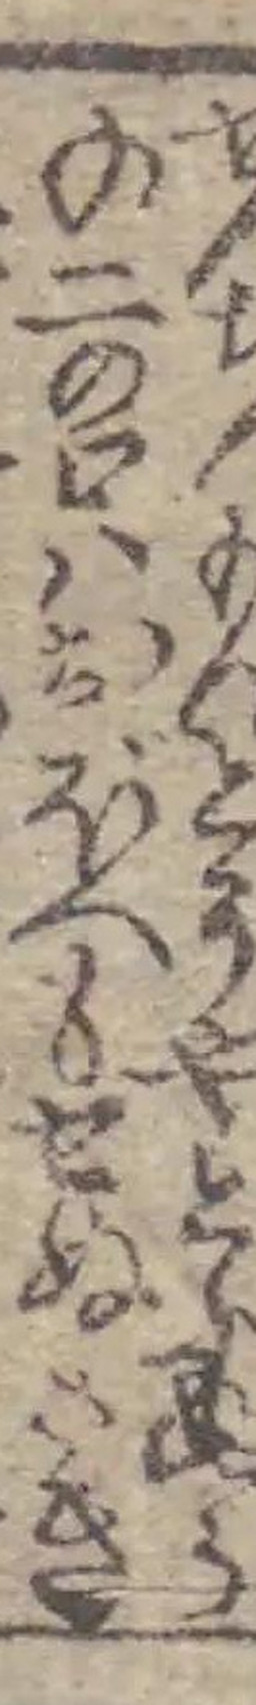の二の口はおぼへもせぬさき
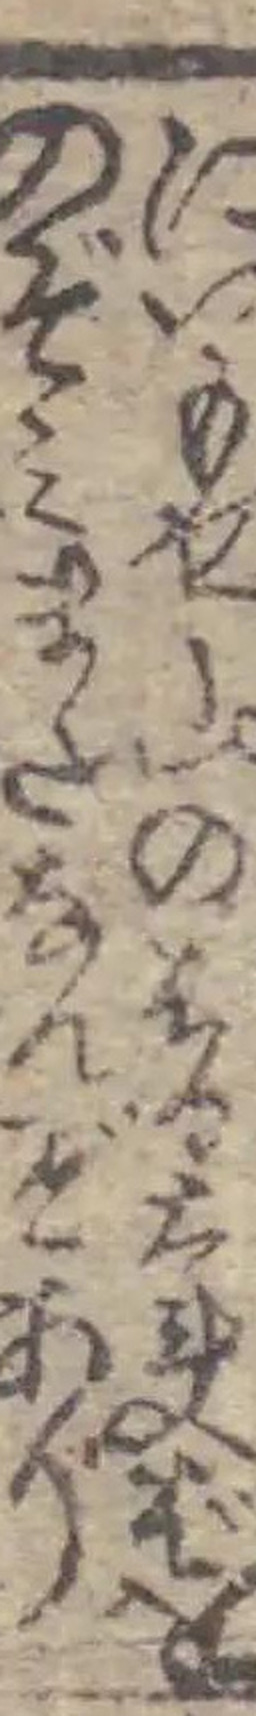のぞみまたなんぞあり
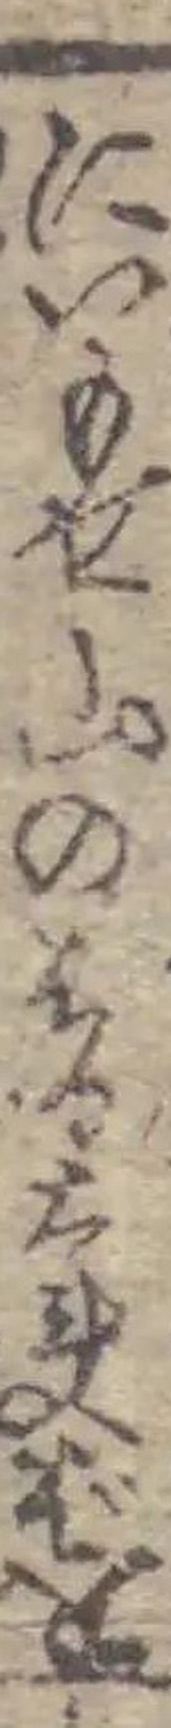にいもせ山のはる太夫ばを
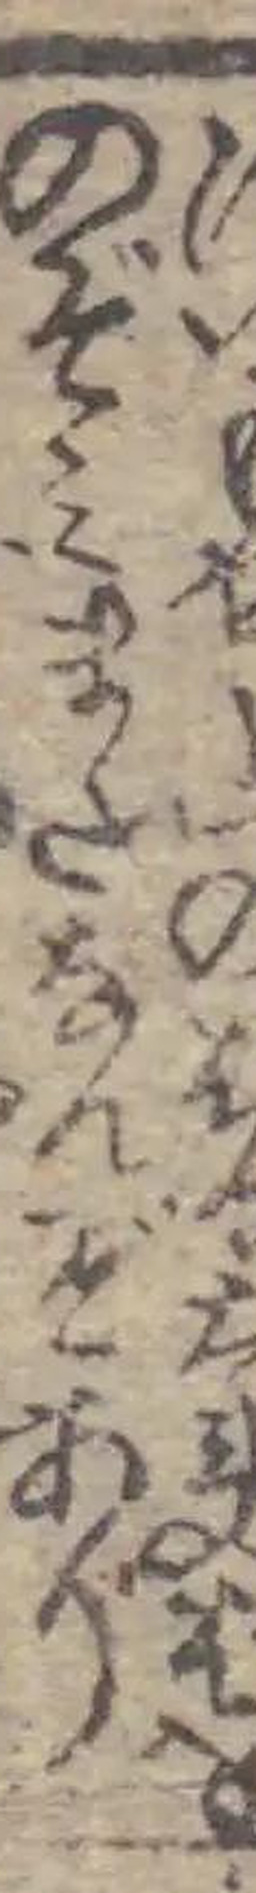のぞみまたなんぞあり
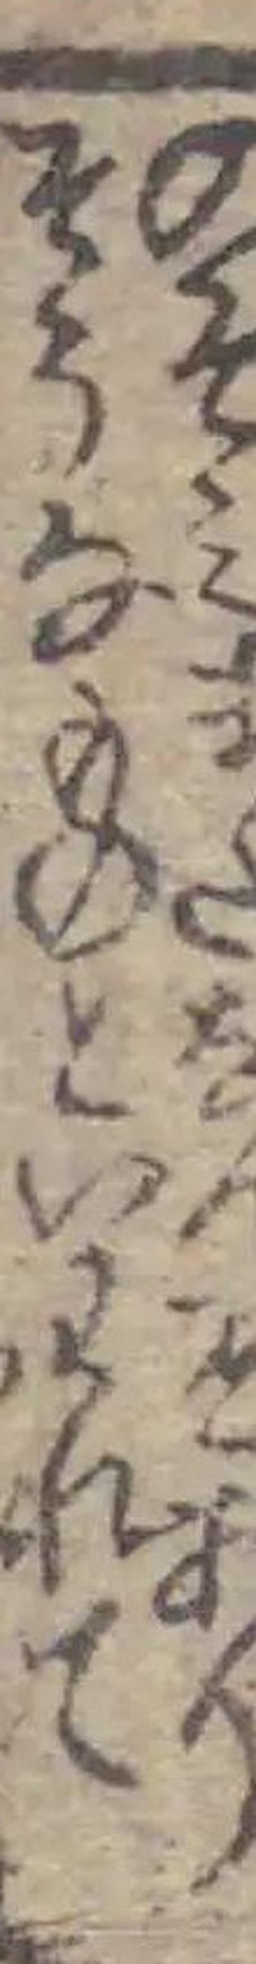そうなものといわれて
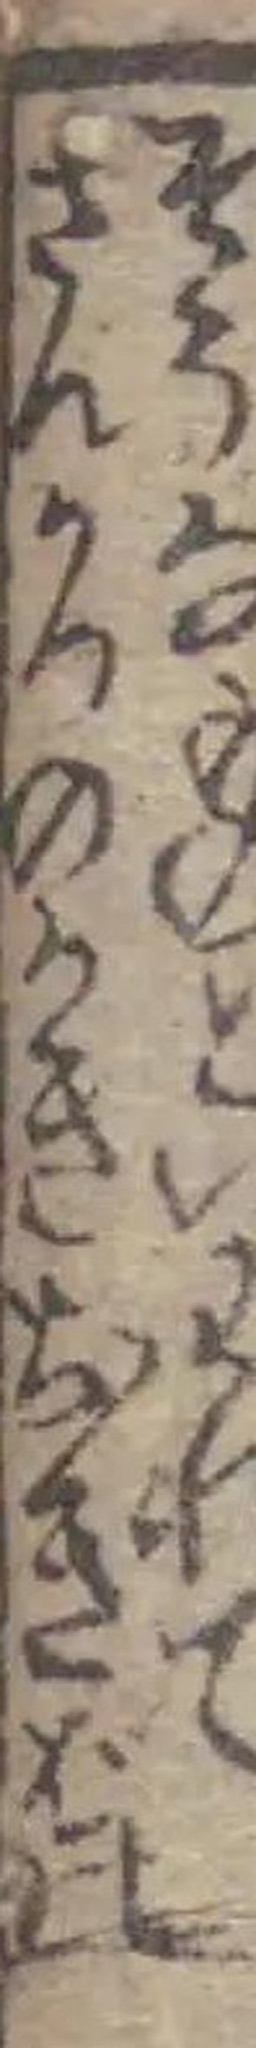さんかつのかきおきばの
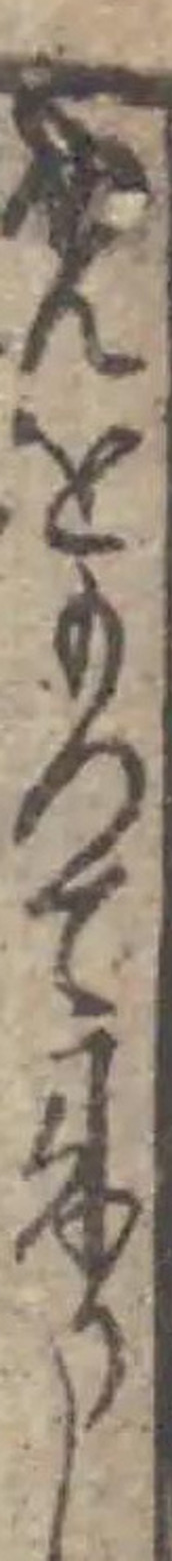んをもつて来りし
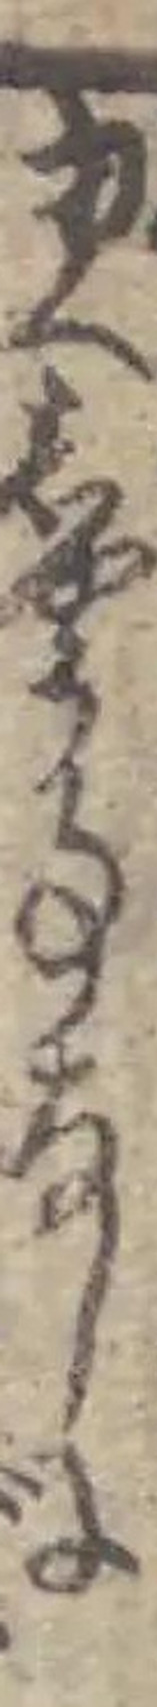ゆへしやう事なしに
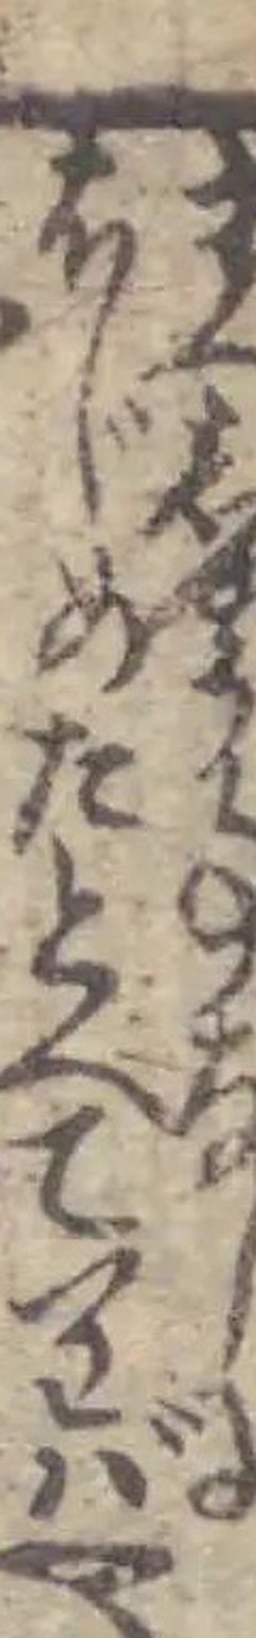はじめたとへていわば
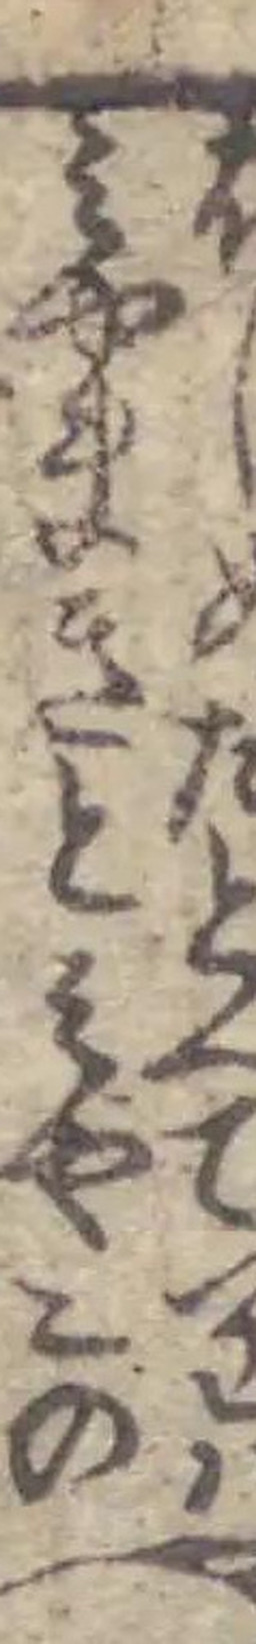みやまきとみやこの
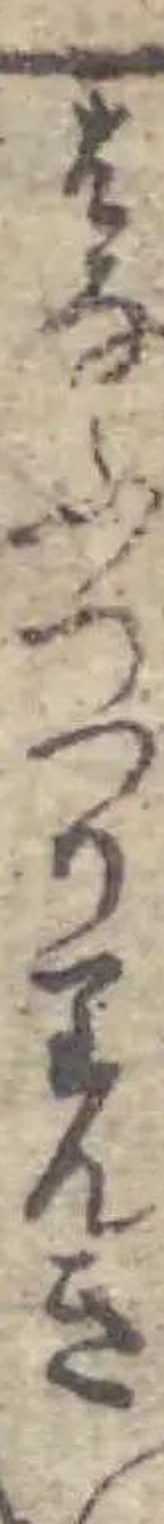はなふつつりわんき
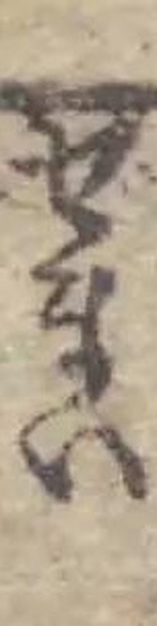せまい
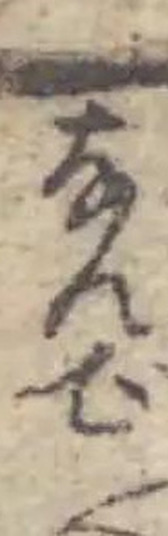なんで
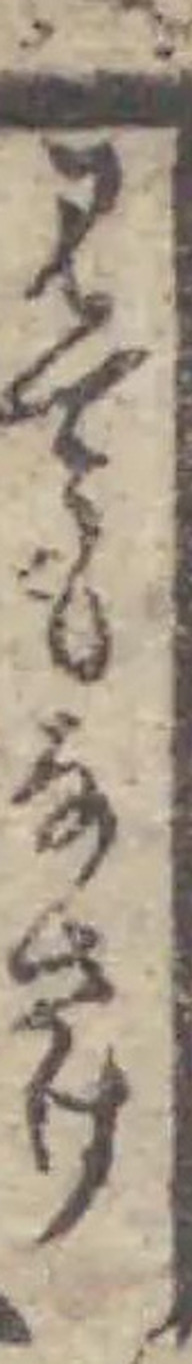見てゝもなさけ
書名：津以曽無弟の甚六 3巻
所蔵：国立国会図書館 National Diet Library, JAPAN
